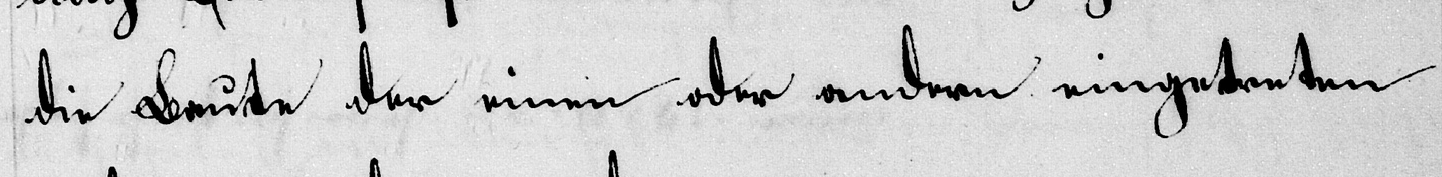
die Baute der einen oder andern eingetreten
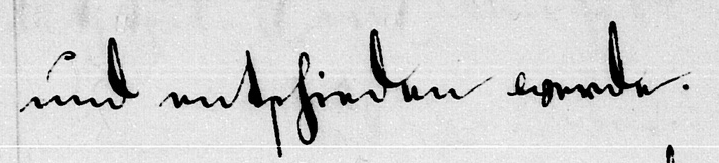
und entschieden werde.
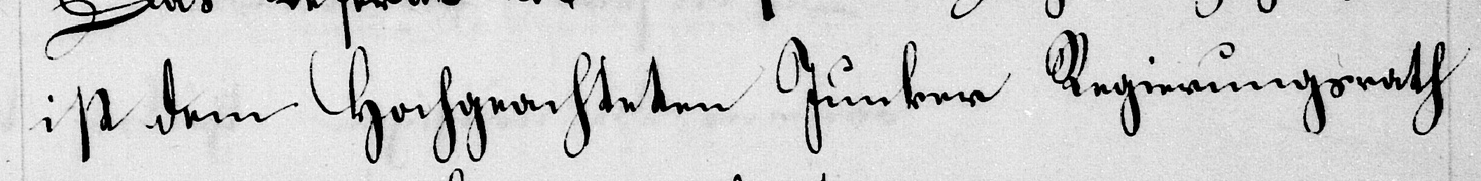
ist dem Hochgeachteten Junker Regierungsrath
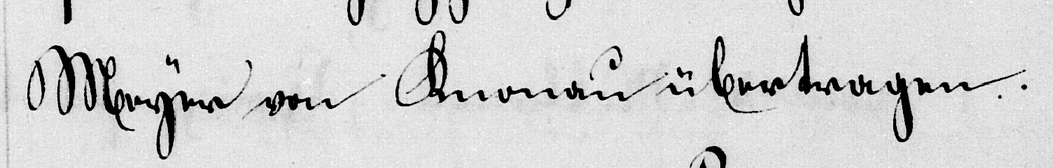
Meyer von Knonau übertragen.
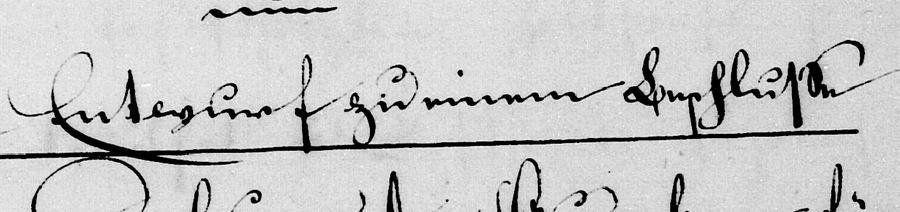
Entwurf zu einem Beschluße
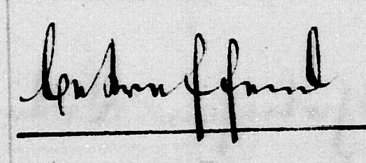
betreffend
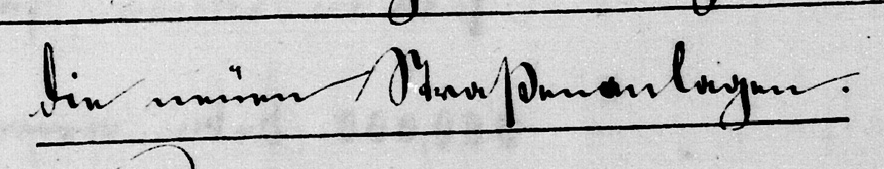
die neuen Straßenanlagen.
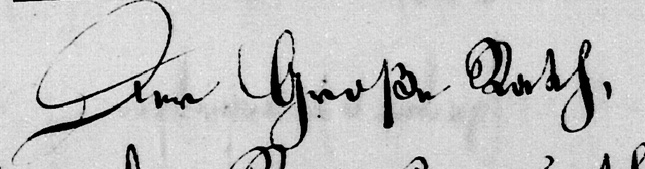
Der Große Rath,
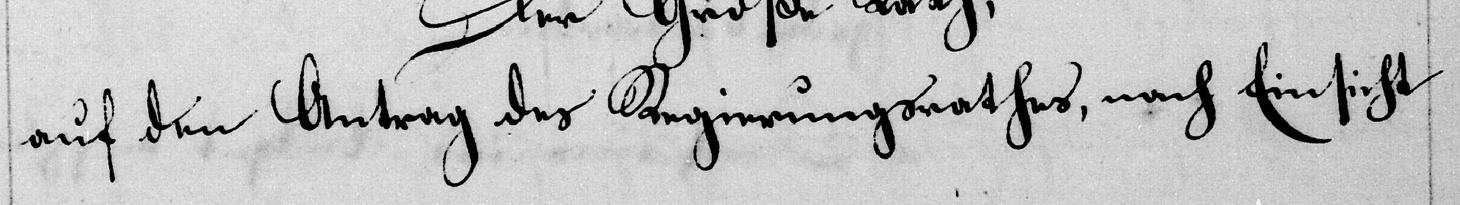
auf den Antrag des Regierungsrathes, nach Einsicht
